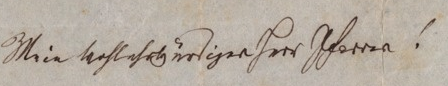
Mein wohlehrwürdiger Herr Pfarrer!
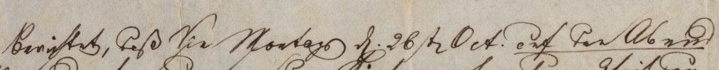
Berichtet, daß Sie Montags d. 26ten Oct. auf den Abend
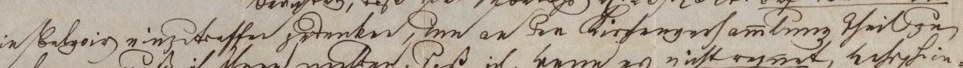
in Belvoir einzutreffen gedenken, um an der Kirchenversammlung Theil zu
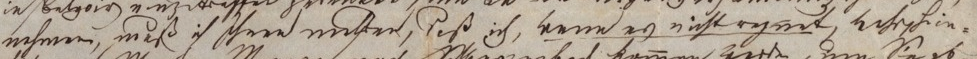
nehmen, muß ich Ihnen melden, daß ich, wenn es nicht regnet, wahrschein-
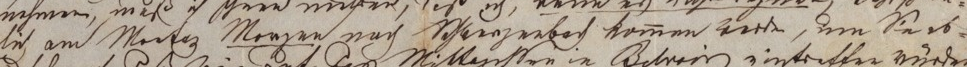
lich am MontagMorgen nach Schwerzenbach kommen werde, um Sie ab-
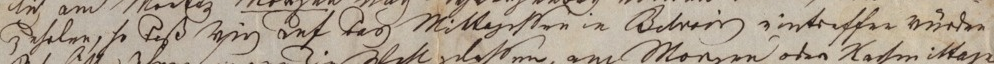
zuholen, so daß wir auf das Mittagessen in Belvoir eintreffen würden.
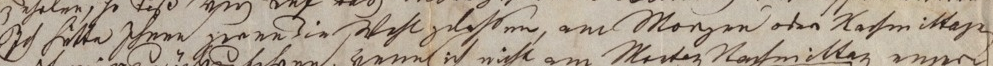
Ich hätte Ihnen gerne die Wahl gelassen, am Morgen oder Nachmittage
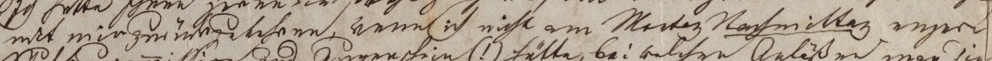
mit mir zurückzukehren, wenn ich nicht am MontagNachmittag engere
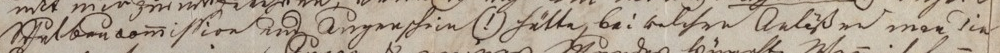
Schulbaucommission und Augenschein (!) hätte, bei welchen Anläßen man die
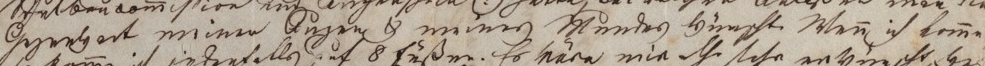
Gegenwart meiner Augen & meines Mundes wünscht. Wenn ich komme,
